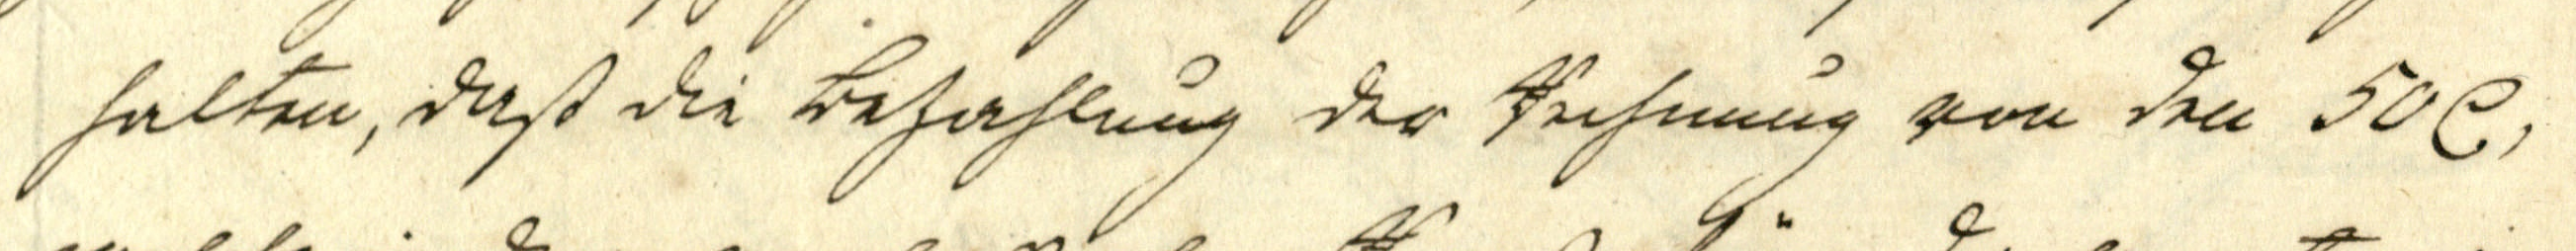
halten, daß die Bezahlung der Rechnung von den 50 l.
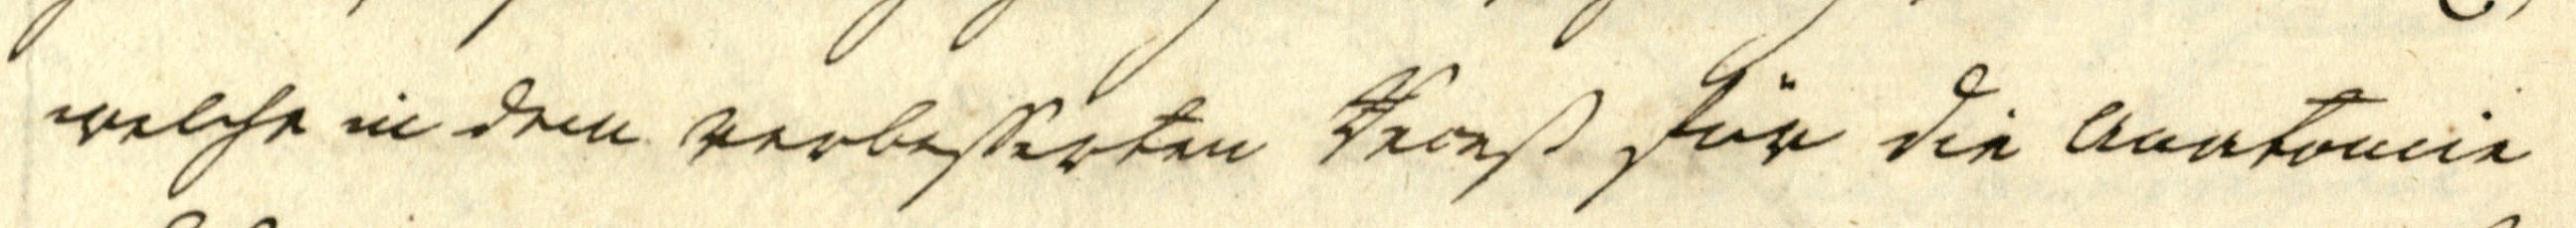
welche in dem verbesserten Receß für die Anatomie
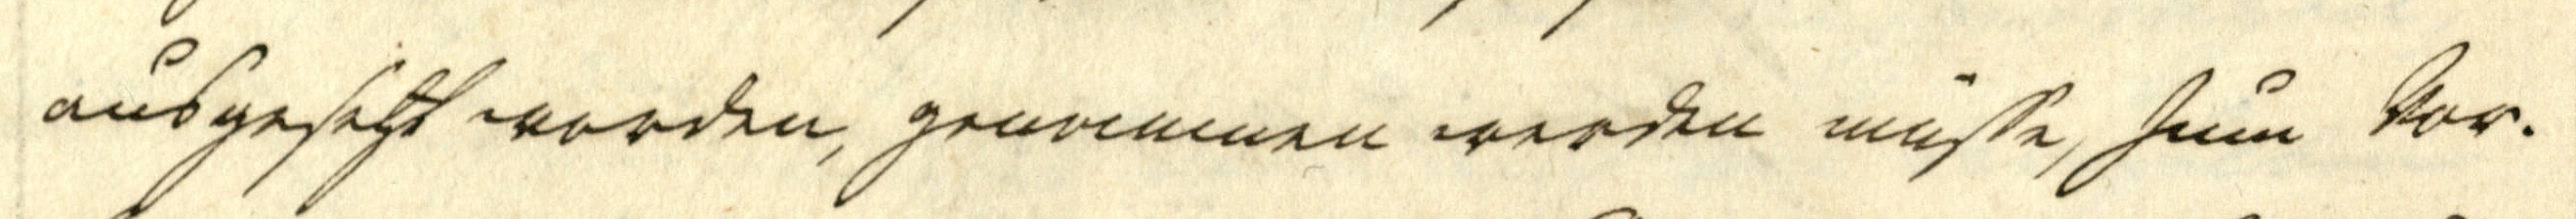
ausgesetzt worden, genommen werden müsse, zum Vor¬
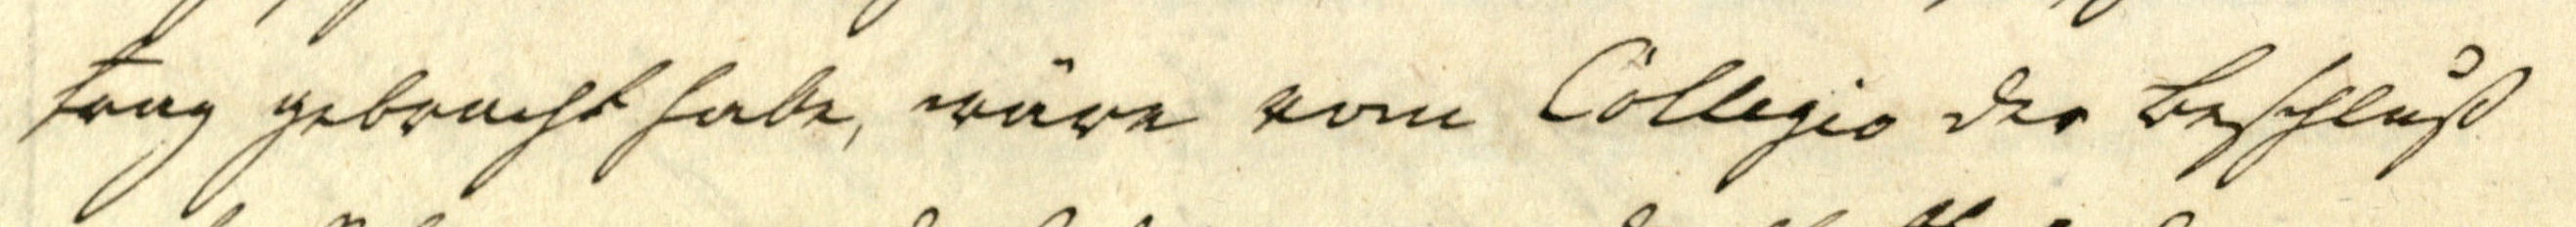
trag gebracht habe, wäre vom Collegio der Beschluß
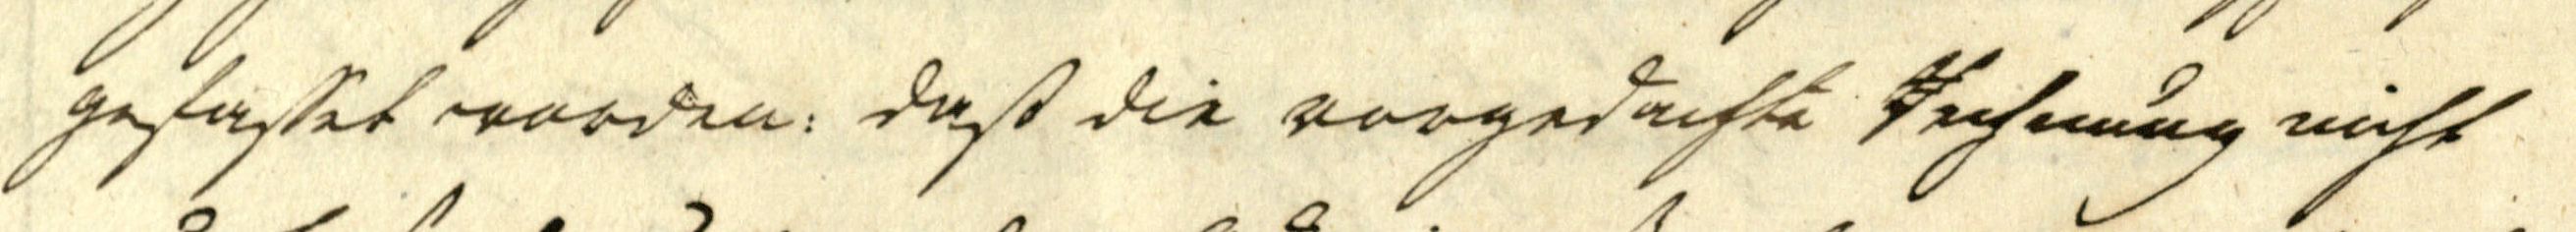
gefasset worden, daß die vorgedachte Rechnung nicht
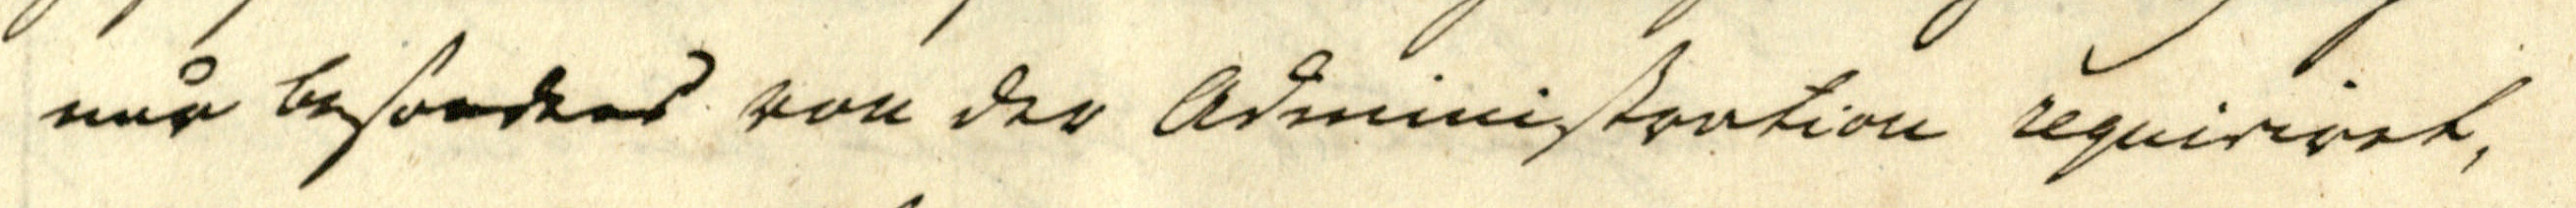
nur besonders von der Administration requiriret,
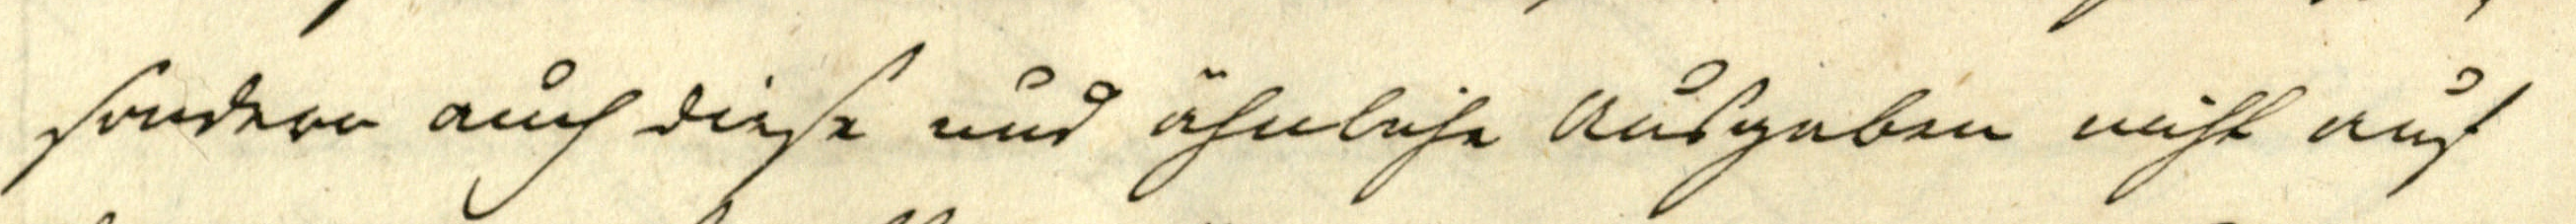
sondern auch diese und ähnliche Ausgaben nicht auf
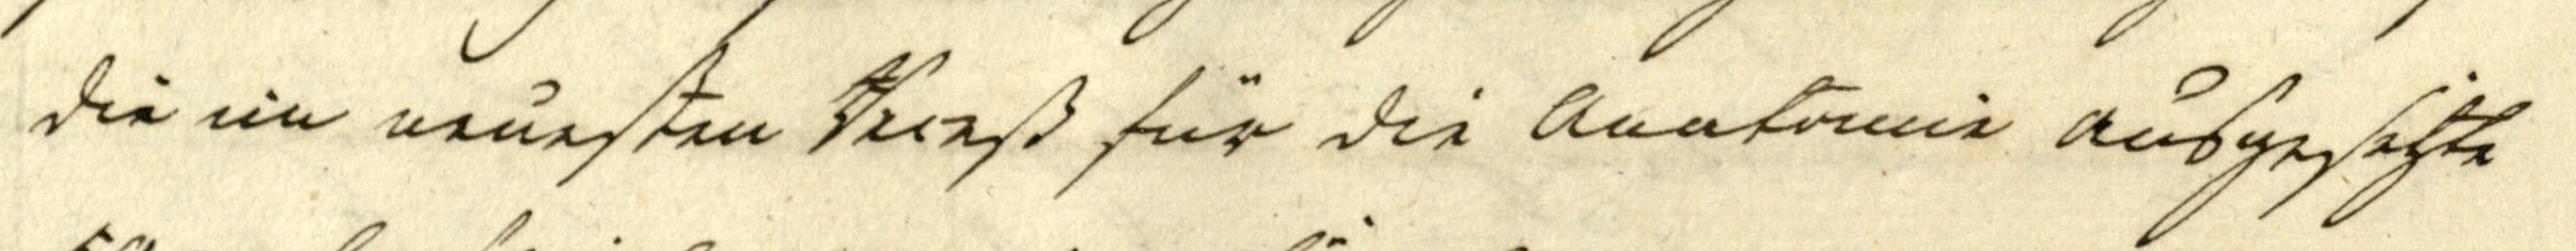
die im neuesten Receß für die Anatomie ausgesetzte
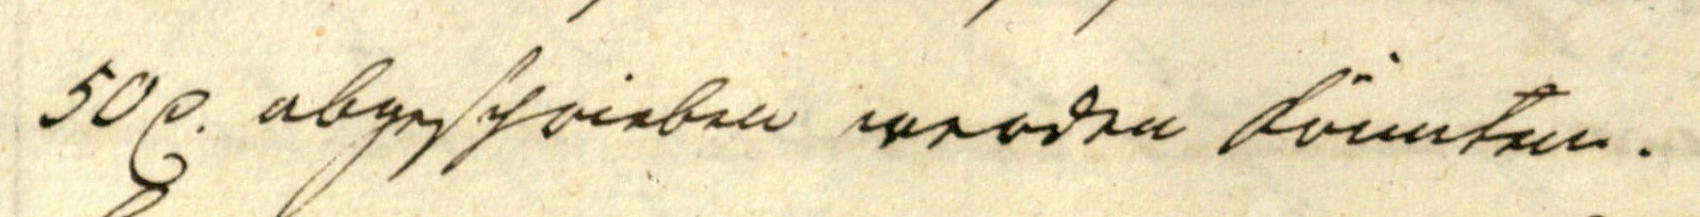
50 l. abgeschrieben werden könnten.
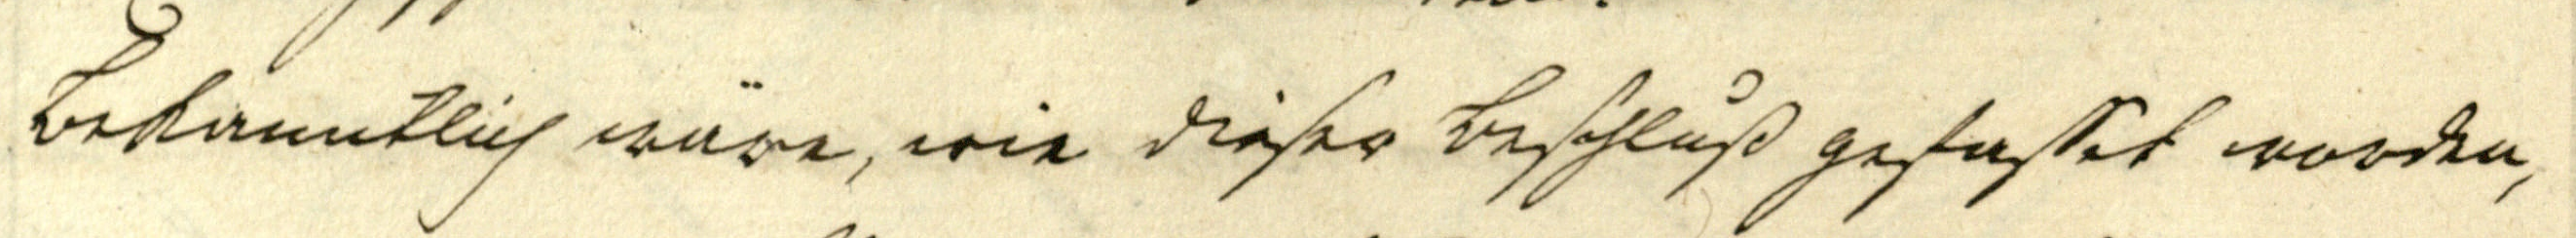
Bekanntlich wäre, wie dieser Beschluß gefasset worden,
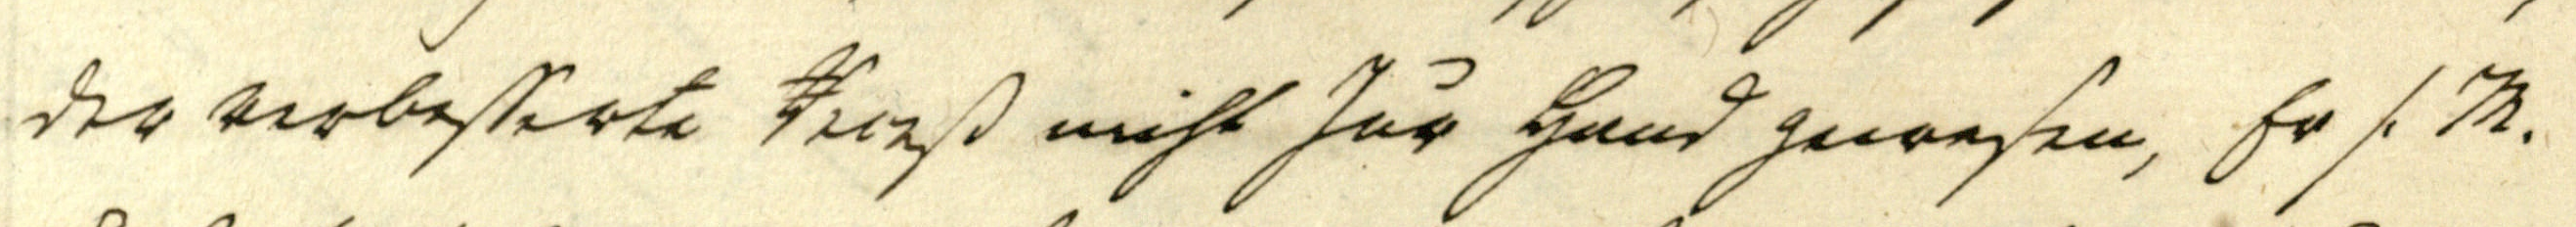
der verbesserte Receß nicht zur Hand gewesen, Er / M.
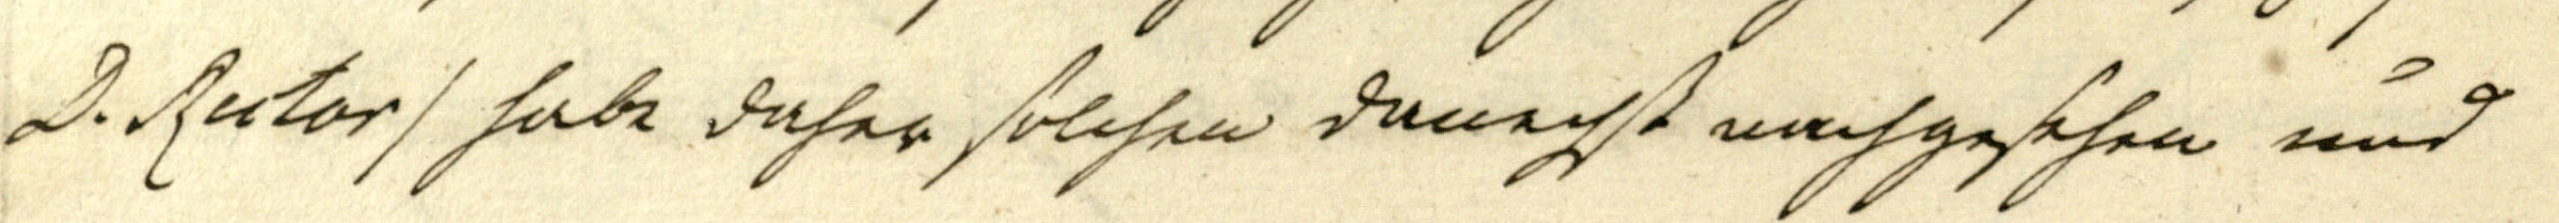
D. Rector/ habe daher solchen danechst nachgesehen und
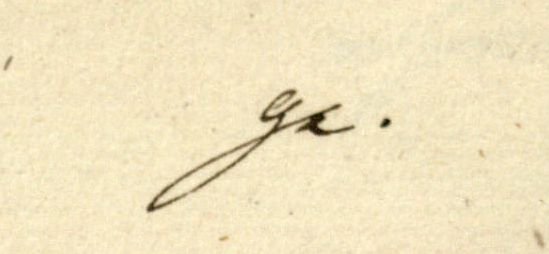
ge.
